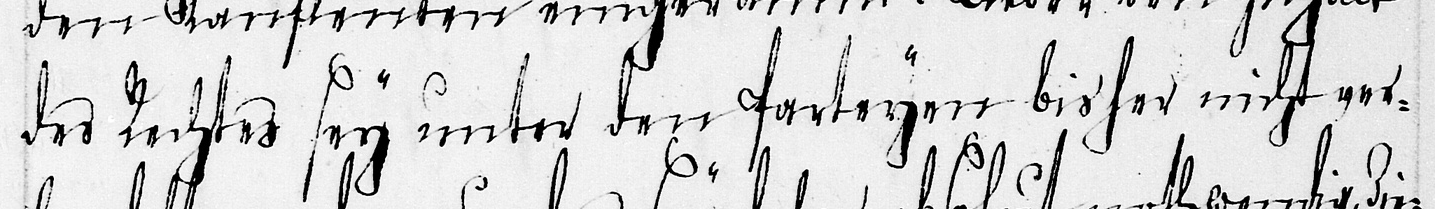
des Rechtes sey unter den Parteyen bisher nicht ver¬
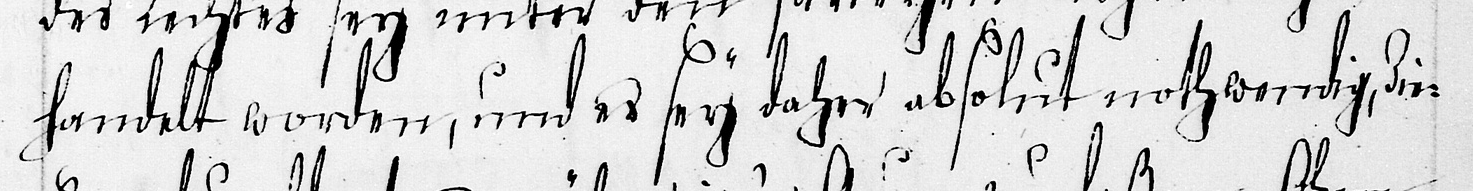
handelt worden, und es sey daher absolut nothwendig, di¬
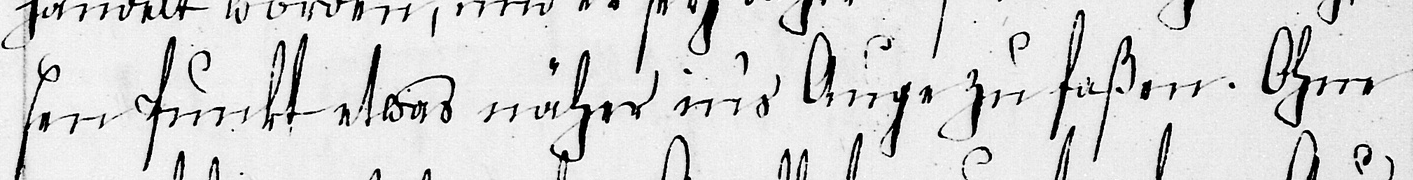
esen Punkt etwas näher in’s Auge zu faßen. Ohne
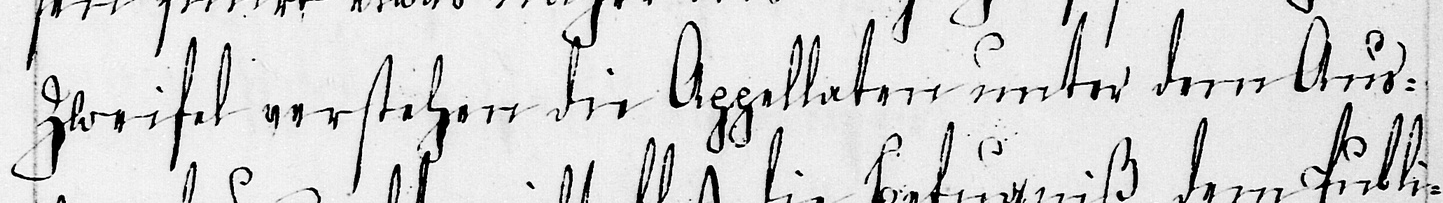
Zweifel verstehen die Appellaten unter dem Aus¬
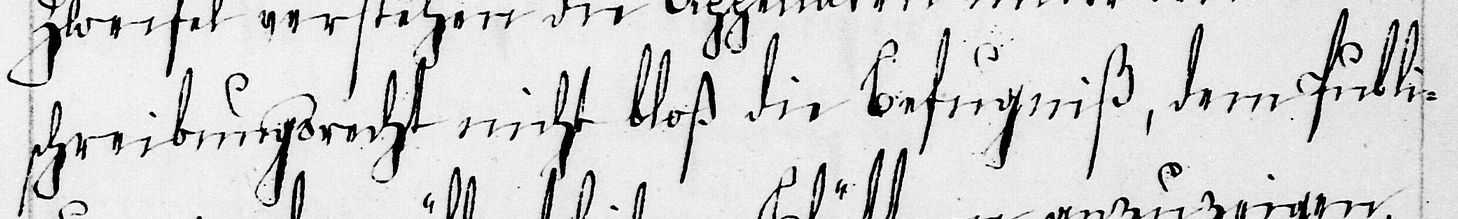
schreibungsrecht nicht bloß die Befugniß, dem Publi¬
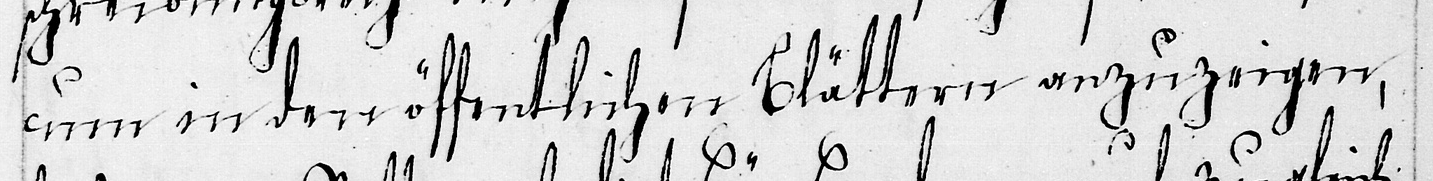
kum in den öffentlichen Blättern anzuzeigen,
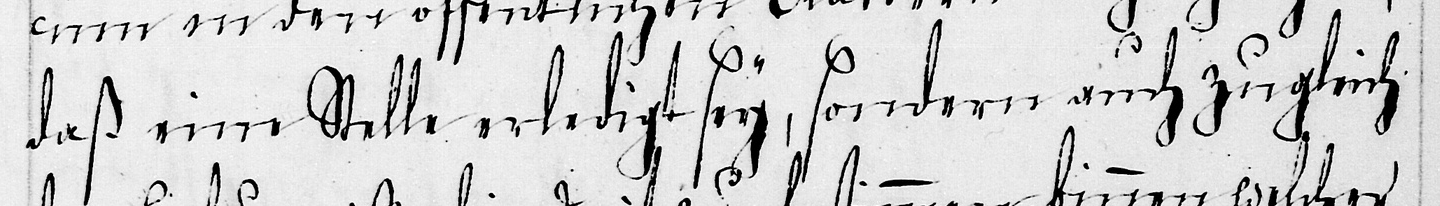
daß eine Stelle erledigt sey, sondern auch zugleich
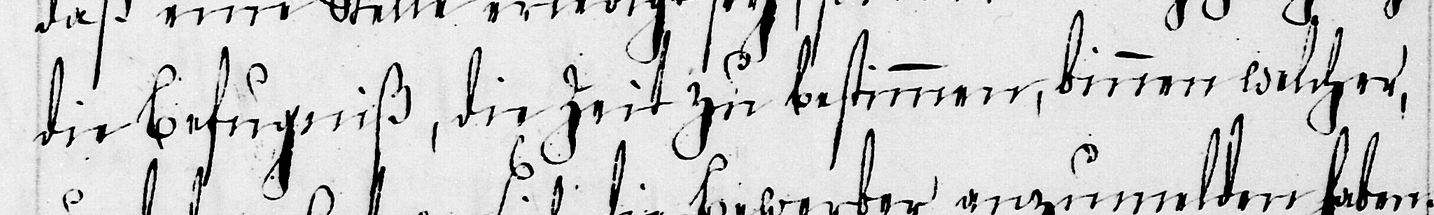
die Befugniß, die Zeit zu bestimmen, binnen welcher,
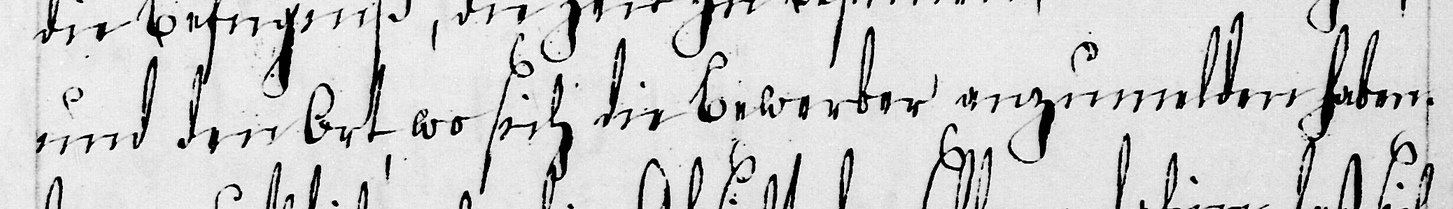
und den Ort, wo sich die Bewerber anzumelden haben.
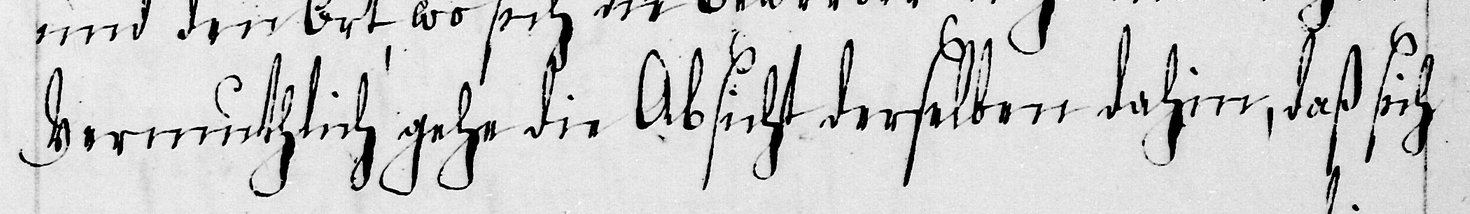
Vermuthlich gehe die Absicht derselben dahin, daß sich
